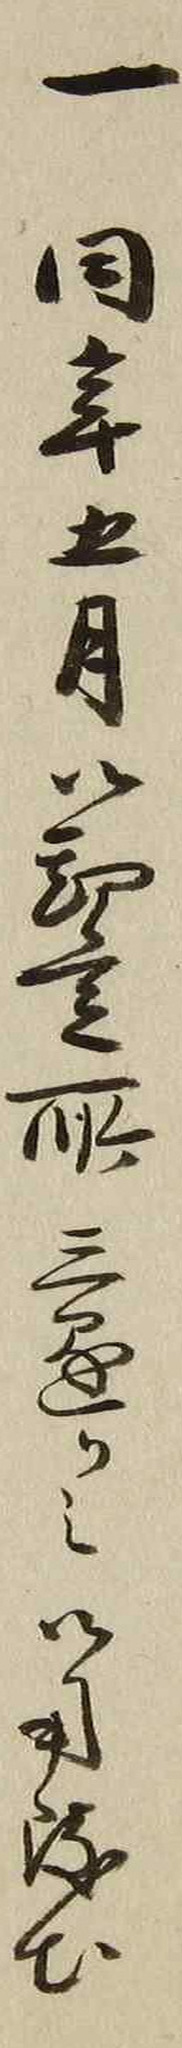一同年五月御勘定所三懸り之御用致出
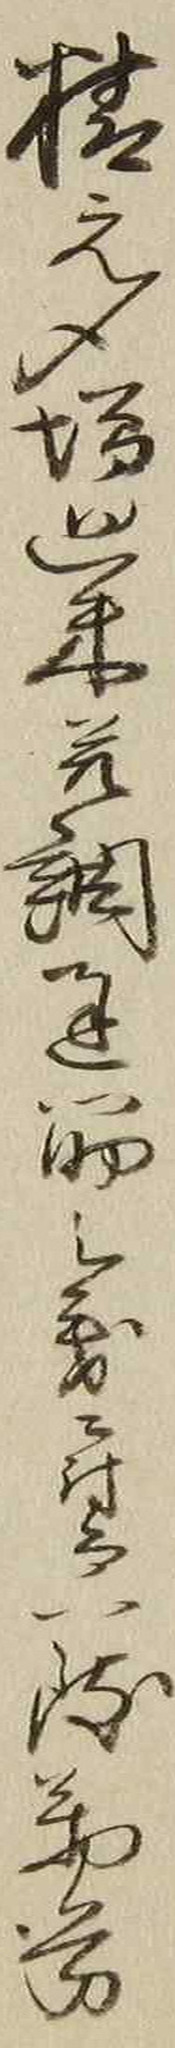精元〆増廻米并調達筋之義ニ付而ハ致勤労
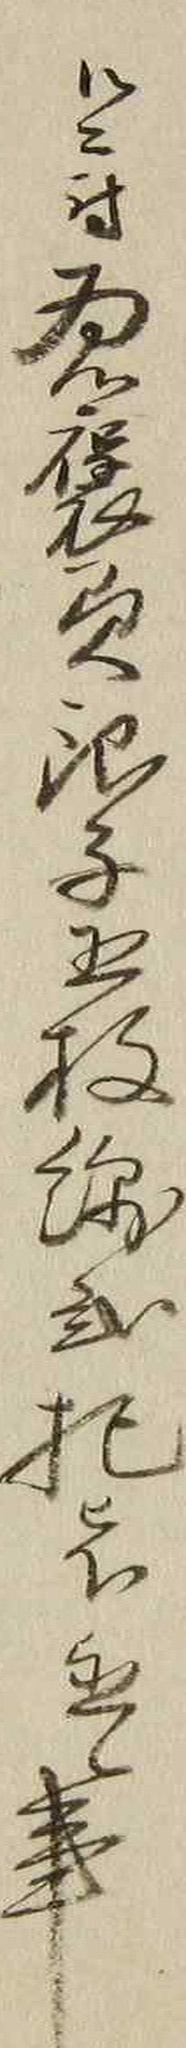候ニ付為御褒美銀子五枚綿弐把被下置候事
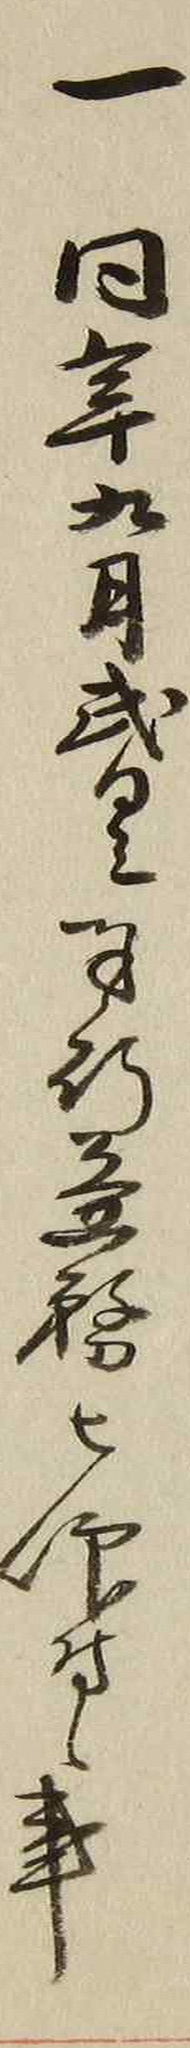一同年九月武具奉行兼務被仰付候事
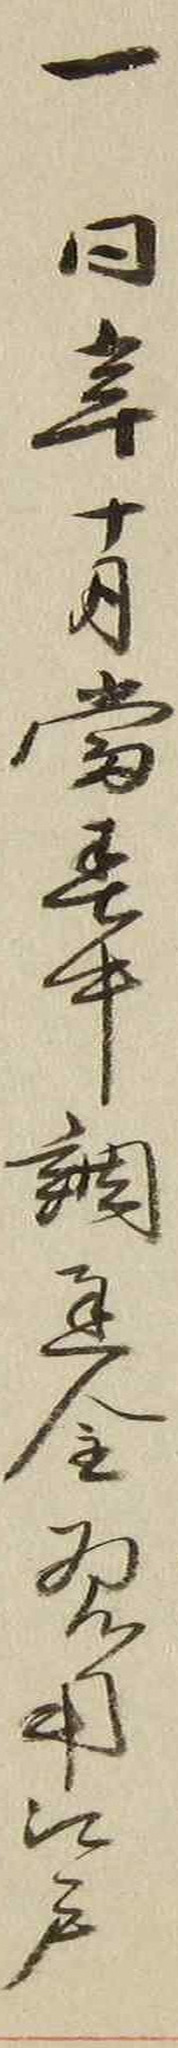一同年十月当春中調達金為御用江戸
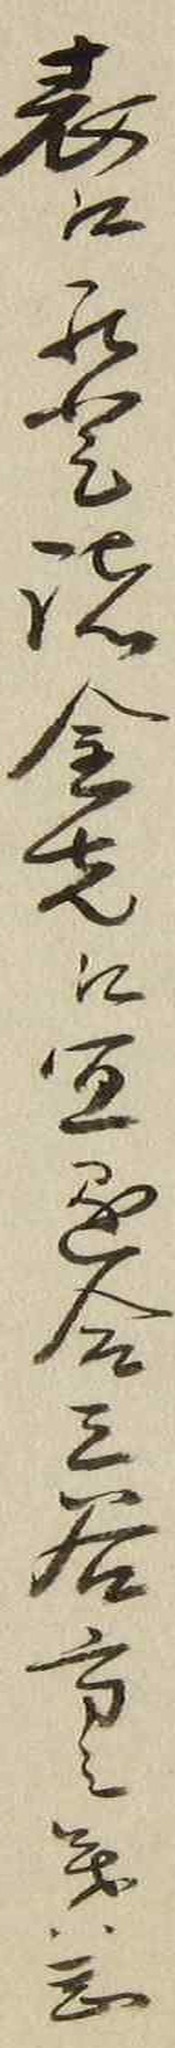表江罷登諸金先江宜懸合三谷方之義ハ甚
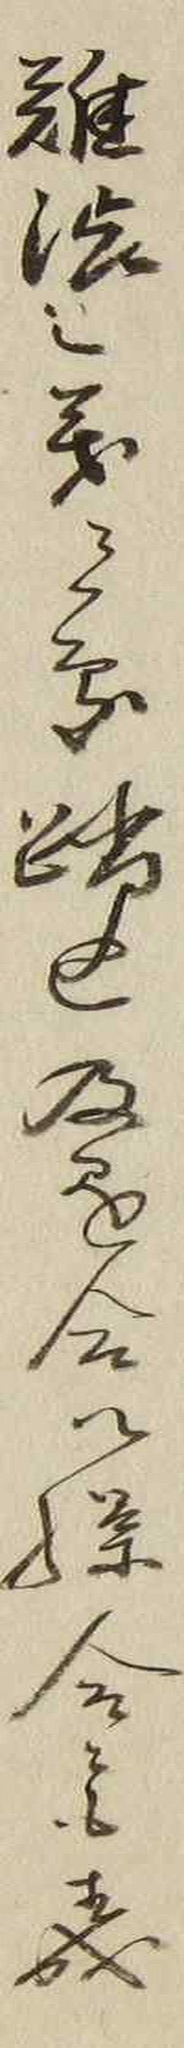難渋之義ニ候処踏込及懸合御繰合ニも相成
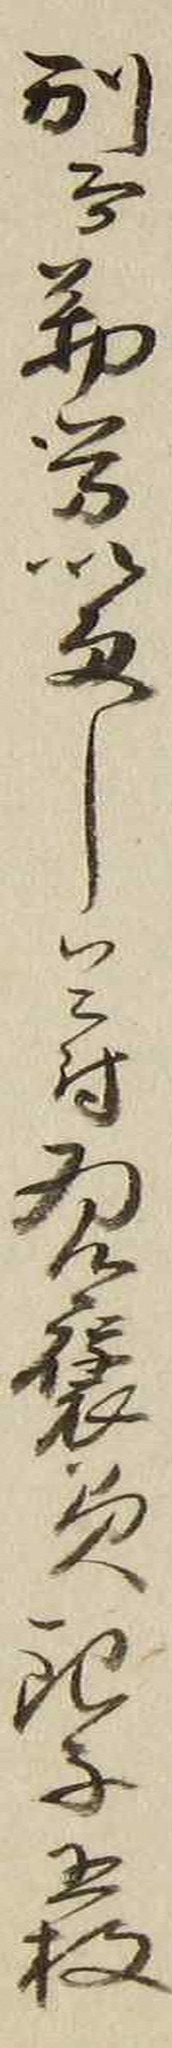別而勤労以多し候ニ付為御褒美銀子五枚
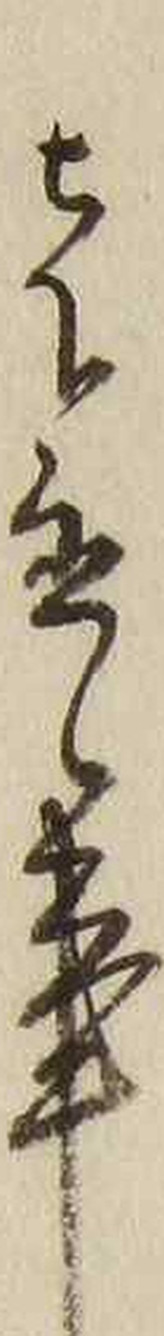被下置候事
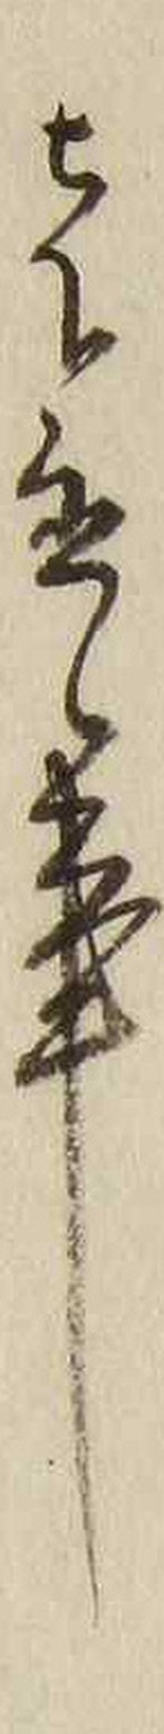被下置候事
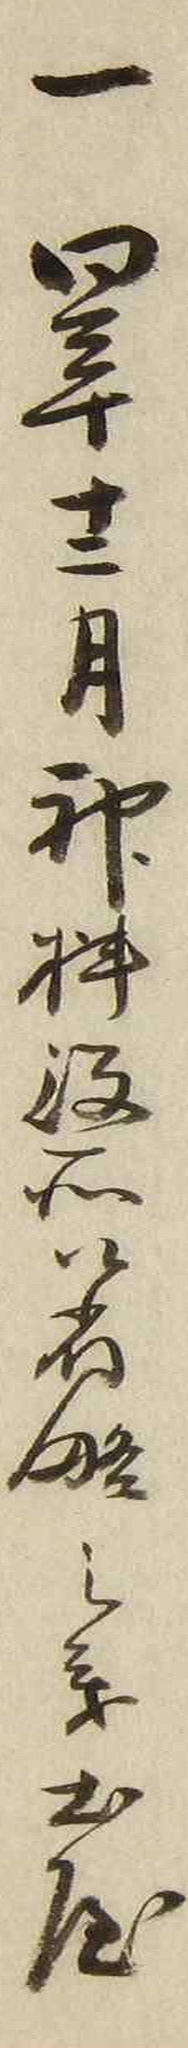一同年十二月神料役所御省略之義土屋

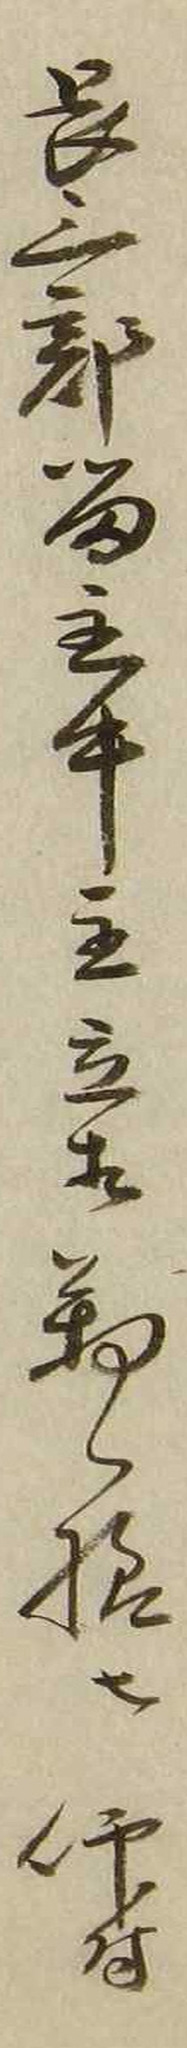長三郎留主中主立相勤候様被仰付
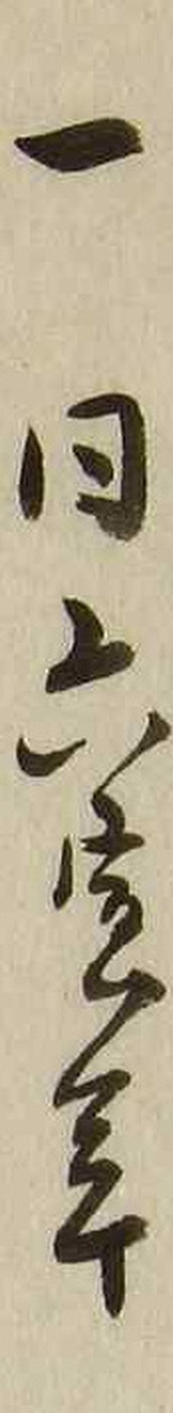一同六寅年
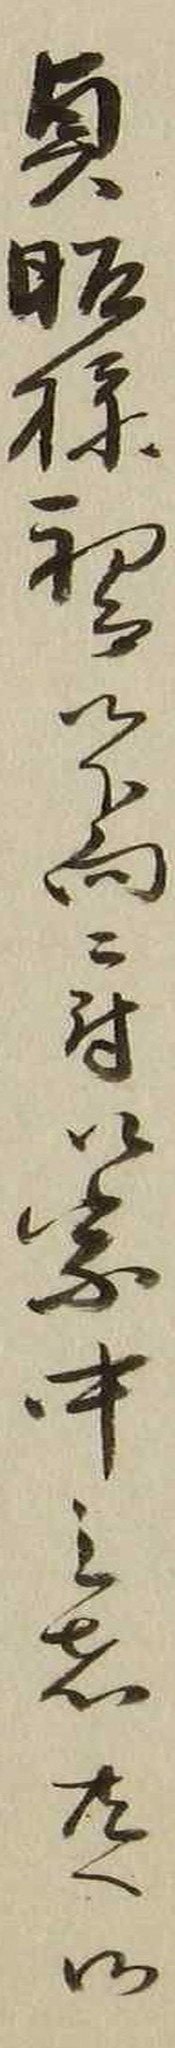貞昭様初而御下向ニ付御家中之者共へ御
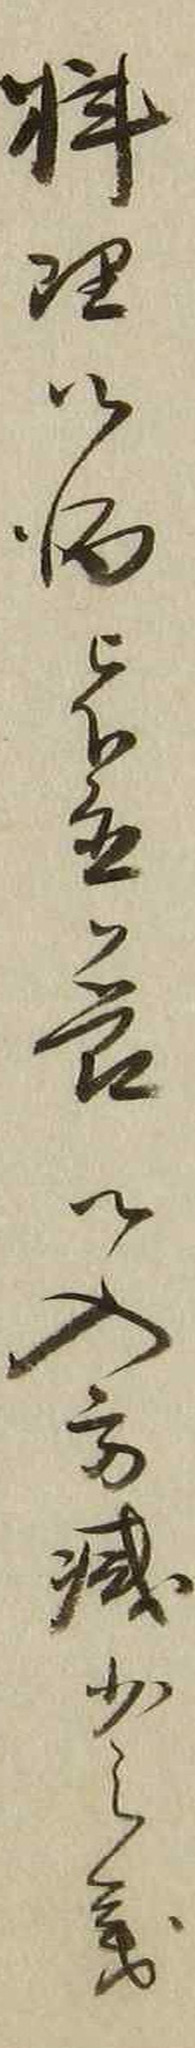料理御酒被下置候節御入方減少之義
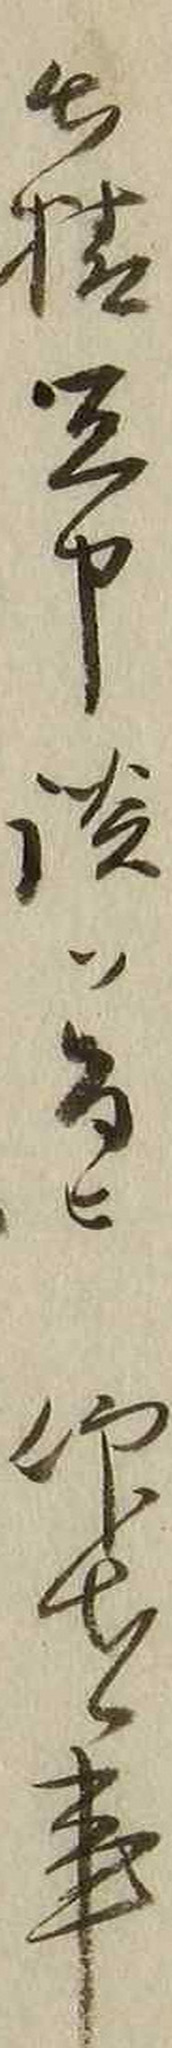出精宜申談候旨被仰出候事
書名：諸士系譜　巻之311　し之部1
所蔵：会津若松市立会津図書館
